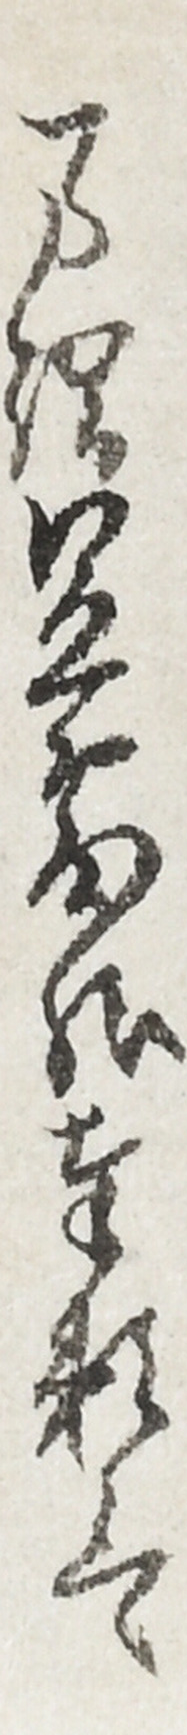万端宜敷様奉頼上候
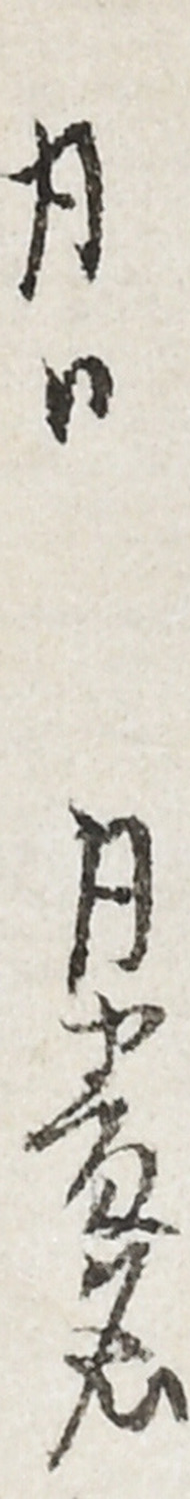月日月番名
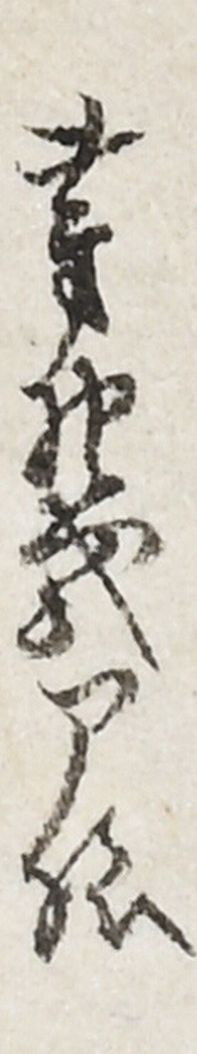茅野式部様
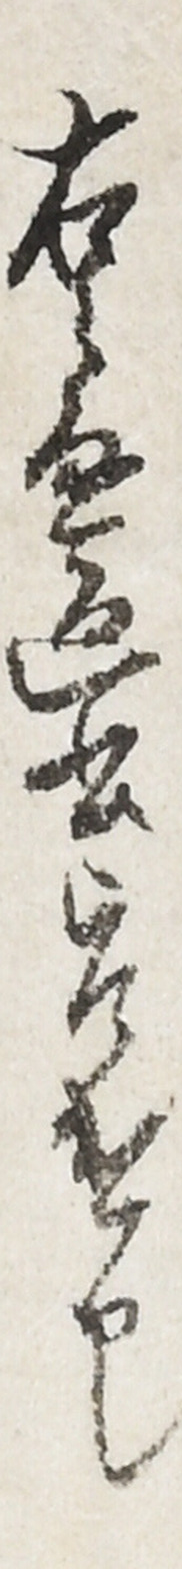右之通書差遣申候
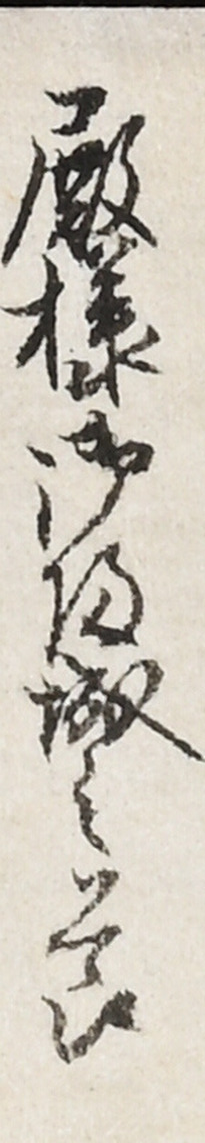殿様御帰城之節
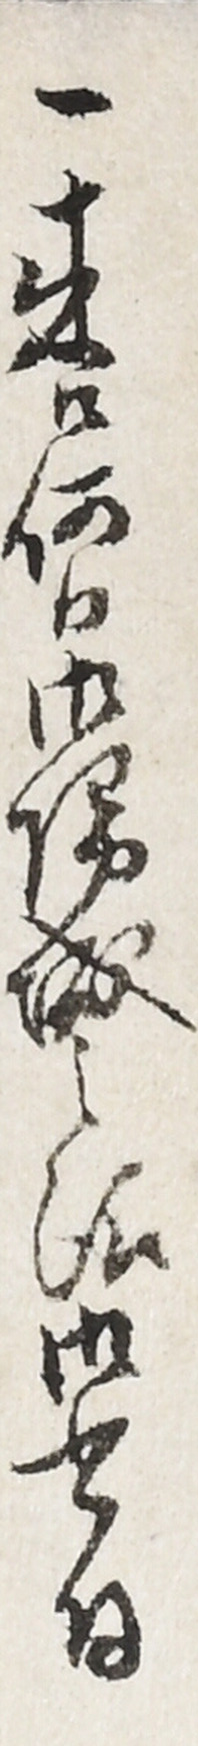一来ル何日御帰城之趣御書付
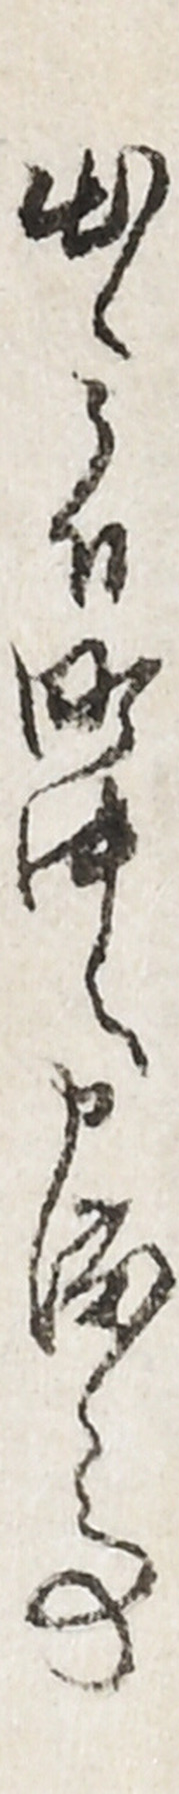出候ニ付町中へ申渡候事
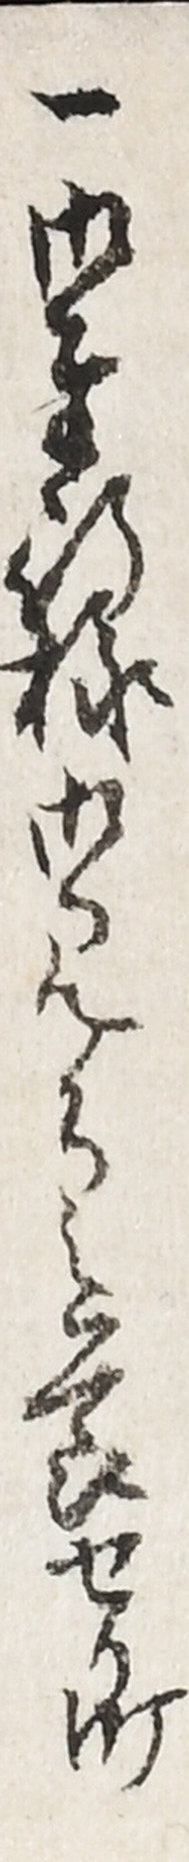一御奉行様御見分之節せり町
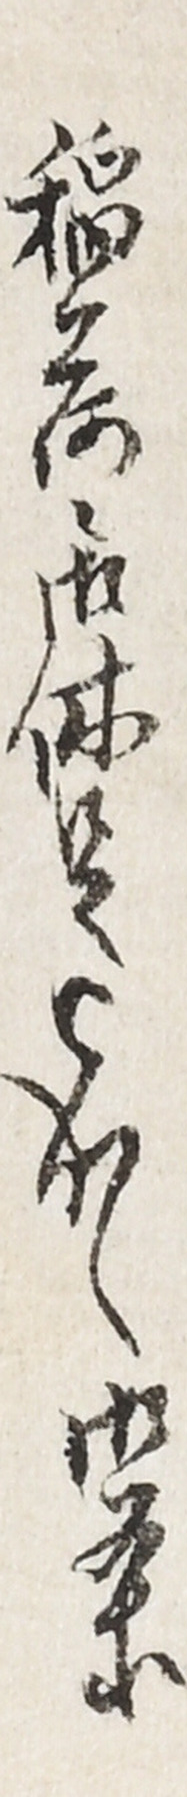稲荷ニ御休足被成候御茶
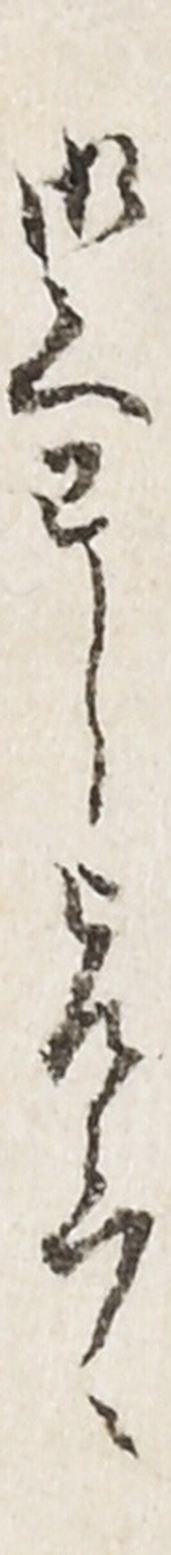御くわし差上候
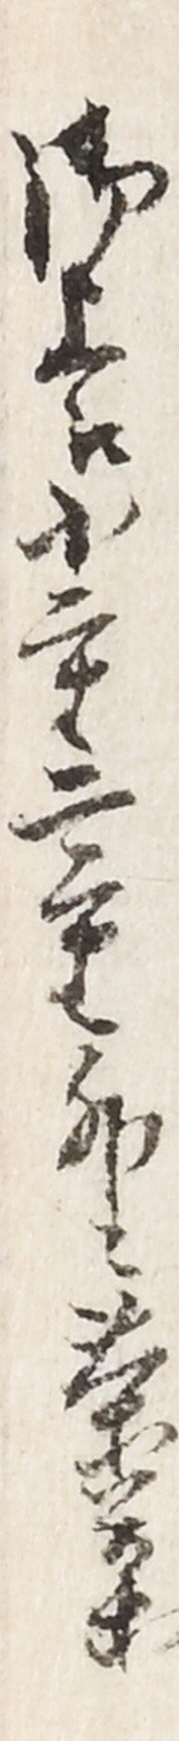御上江小重二重外ニ茶菓
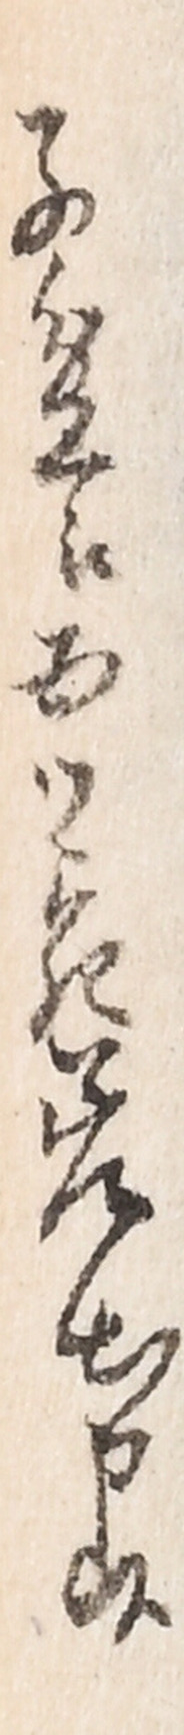子盆江五ツ宛差出申候
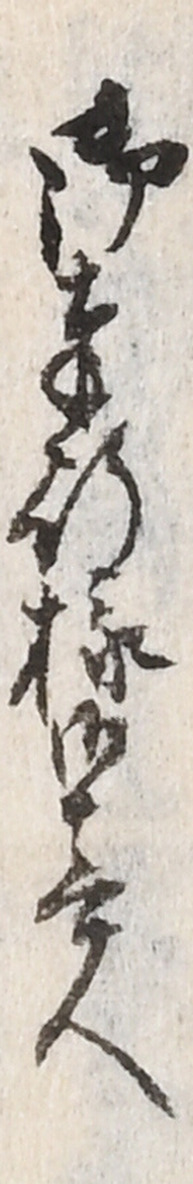御奉行様御十壱人
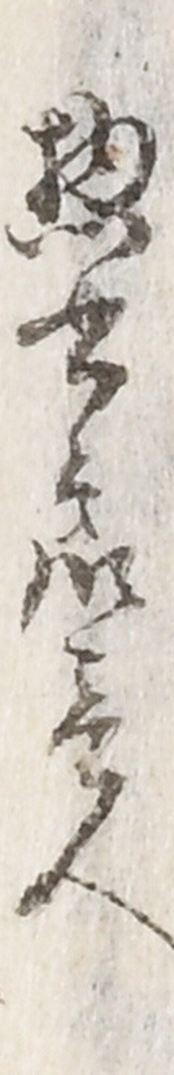惣書衆壱人
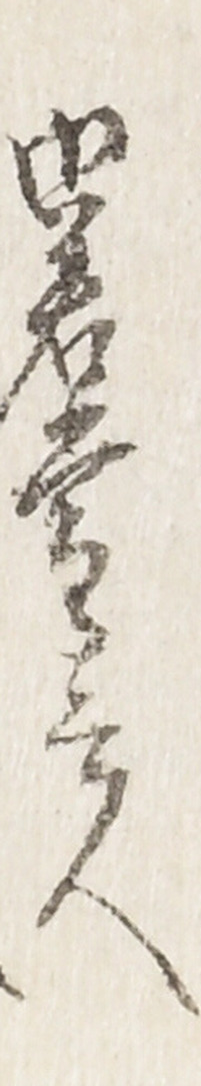御若党壱人
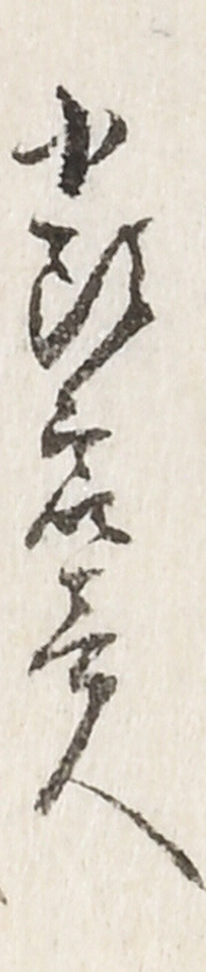小頭衆壱十
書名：年内行事懐中録
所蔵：伊那市立高遠町図書館・合同会社AMANE
